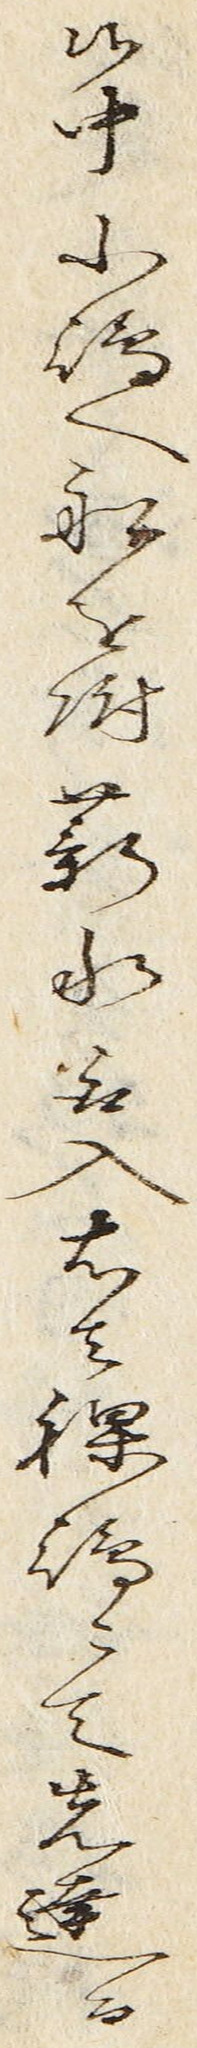候中小嶋へ船を附薪水取入右は裸嶋にて先達而
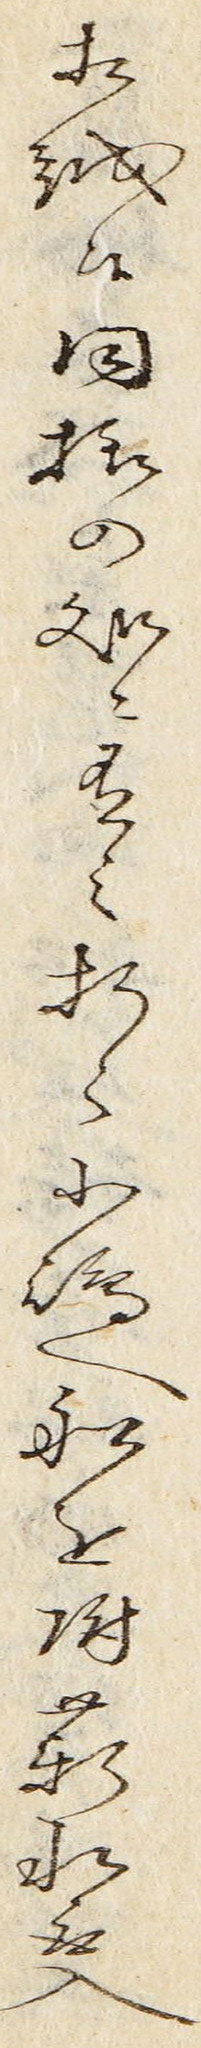相越候同様の処に有之折々小嶋へ船を附薪水取入
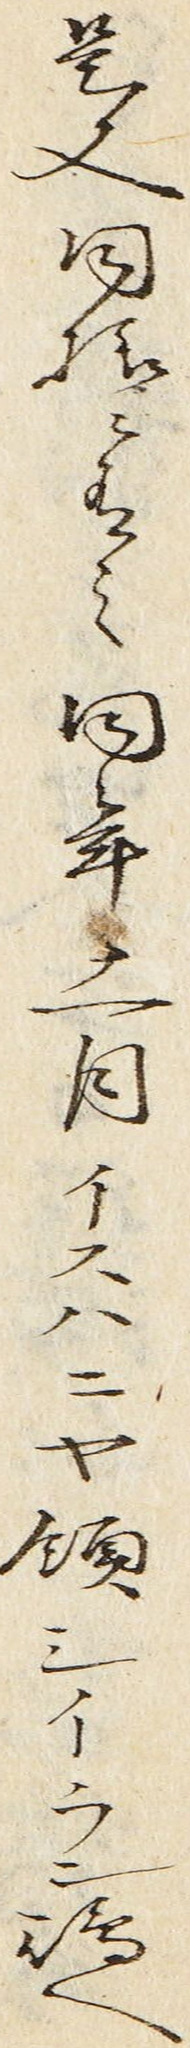是又同様に有之同年十一月イスハニヤ領シイラン嶋へ
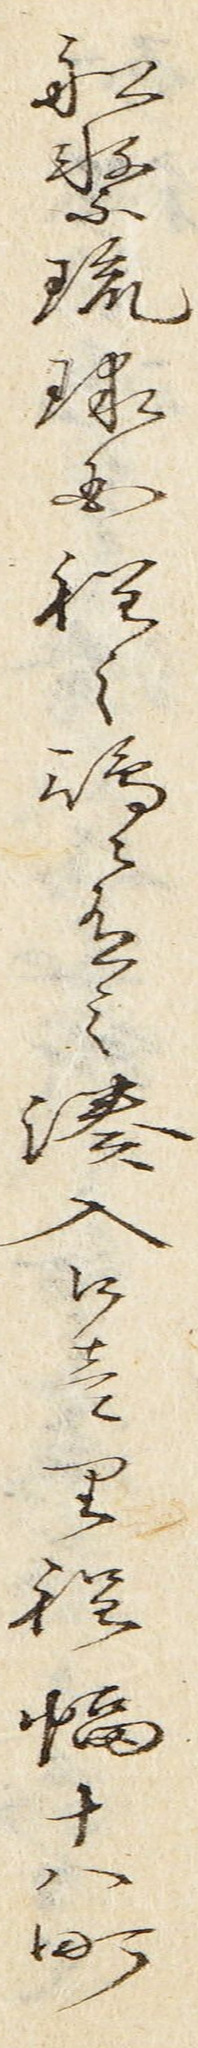船繋琉球国程之嶋に有之湊入口壱里程幅十八町
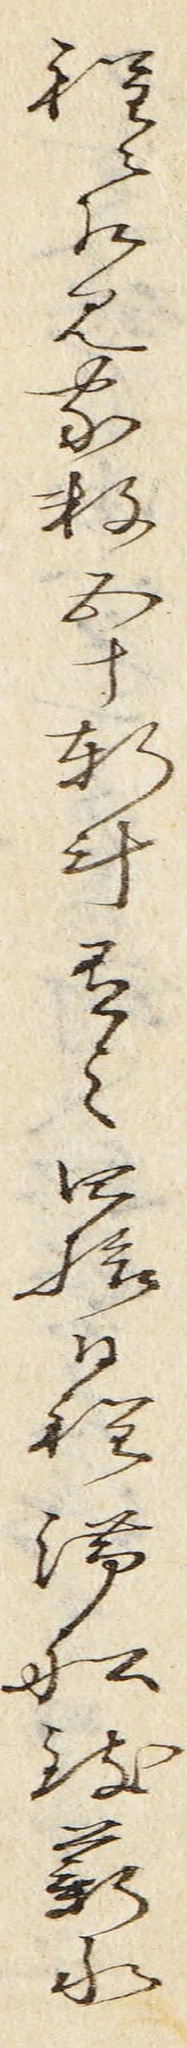程に相見家数五十軒計有之四拾日程滞船致薪水

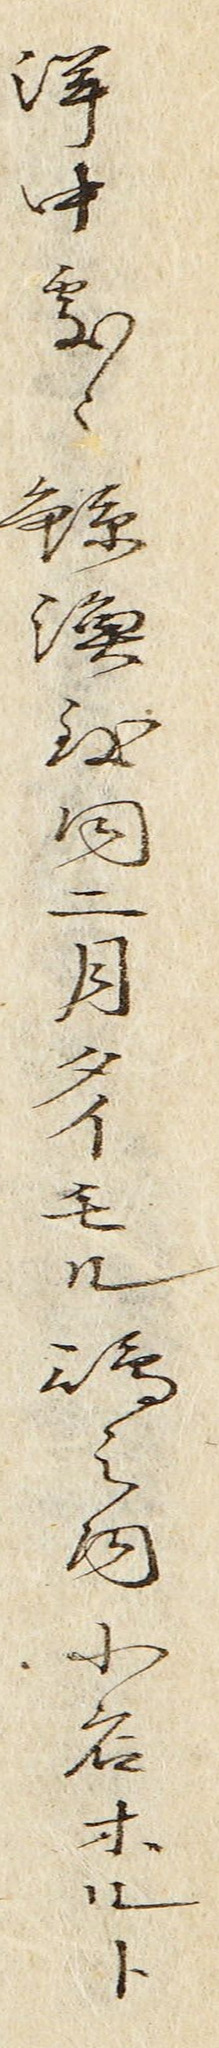洋中処々鯨漁致同二月タイモル嶋之内小名ホルト
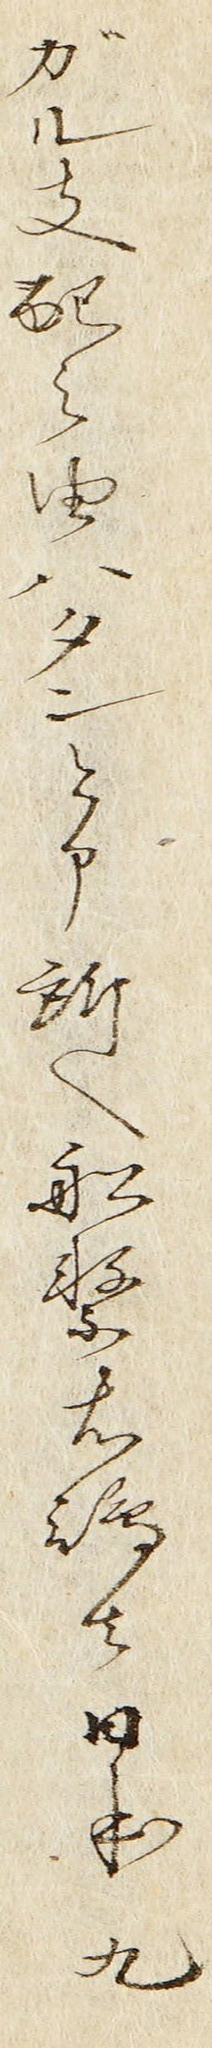ガル支配之由ハタンと申所へ船繋右嶋は日本九
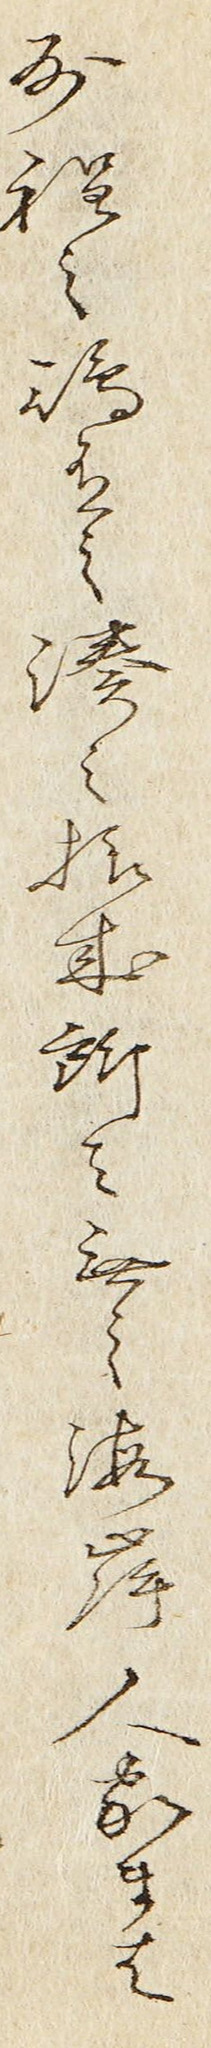州程之嶋有之湊之様成所々無之海岸人家まは
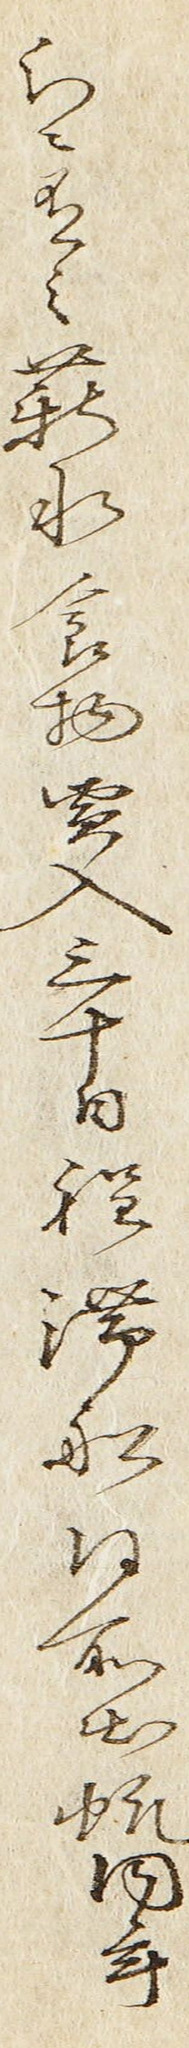らに有之薪水食物買入三十日程滞船同所出帆同年
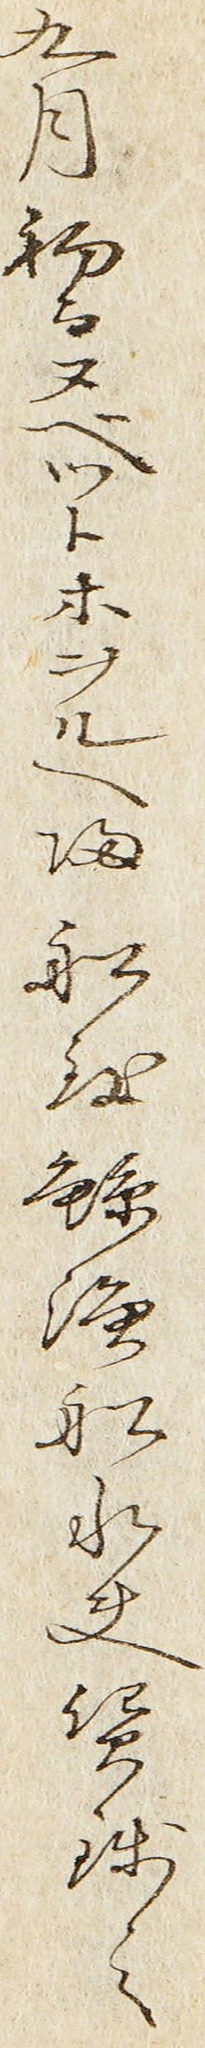九月初而ヌベツトホヲルへ帰船致鯨漁船水夫賃銭之
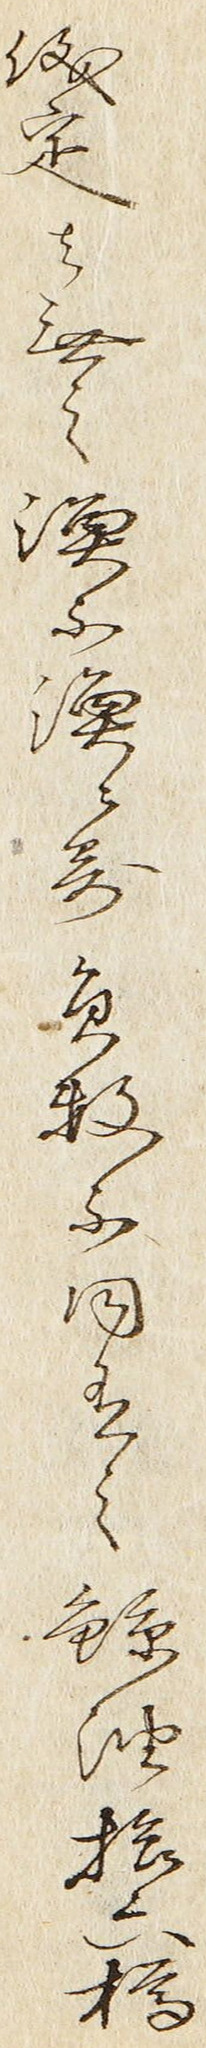儀定は無之漁不漁に寄員数不同有之鯨油拾六樽
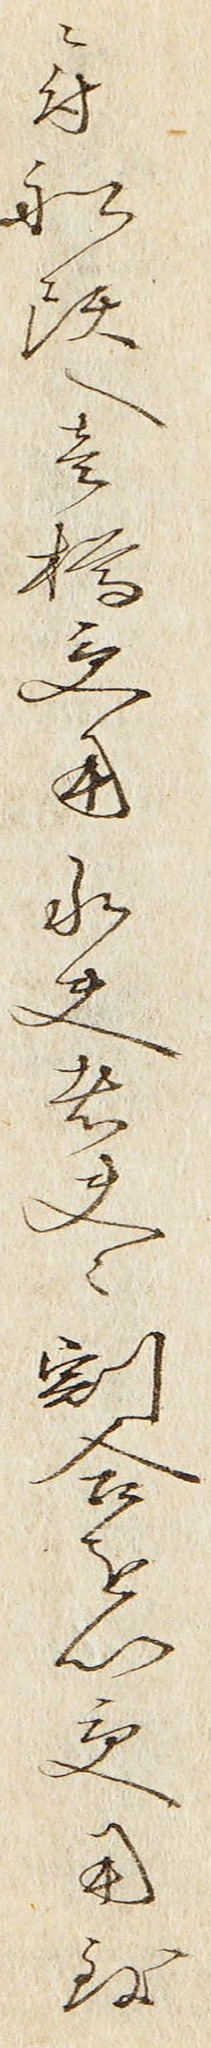に付船頭へ壱樽受用水夫は夫々割合を以受用致
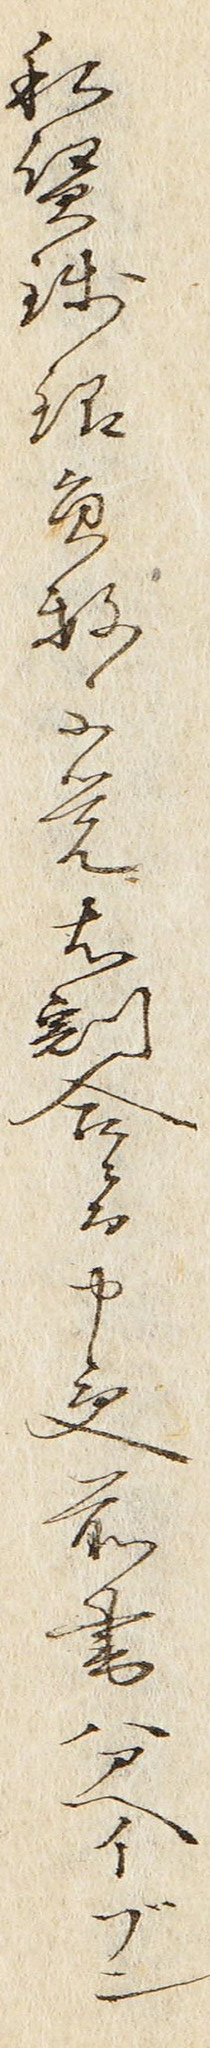私賃銭銀員数不覚右割合に而申受前書ハアへイブン
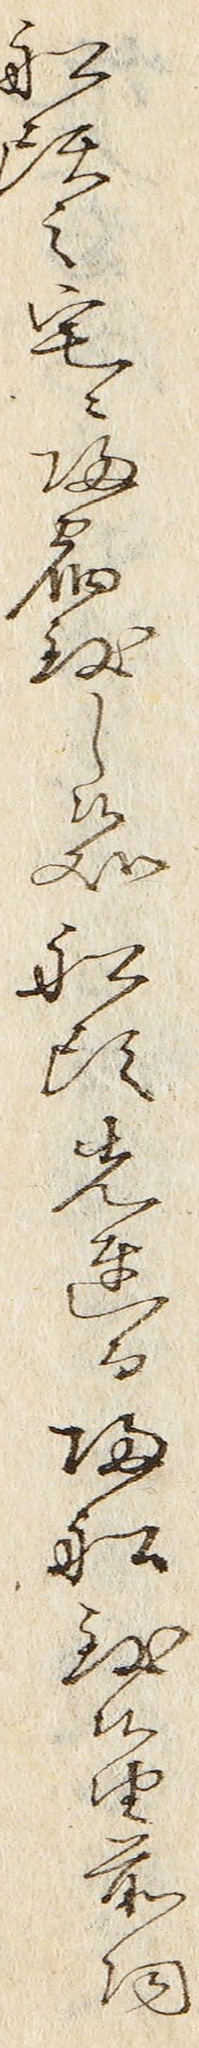船頭之宅に帰宿致し候処船頭先達而帰船致候由前同
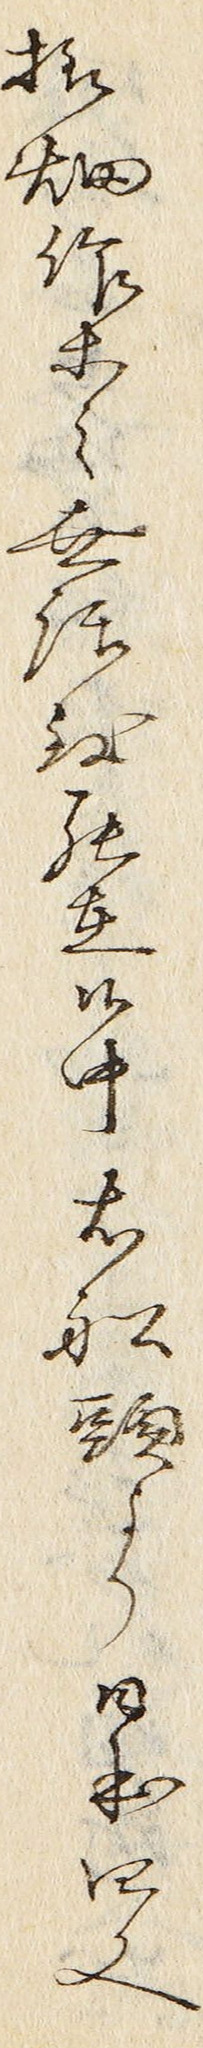様畑作等之世話致罷在候中右船頭より日本四文
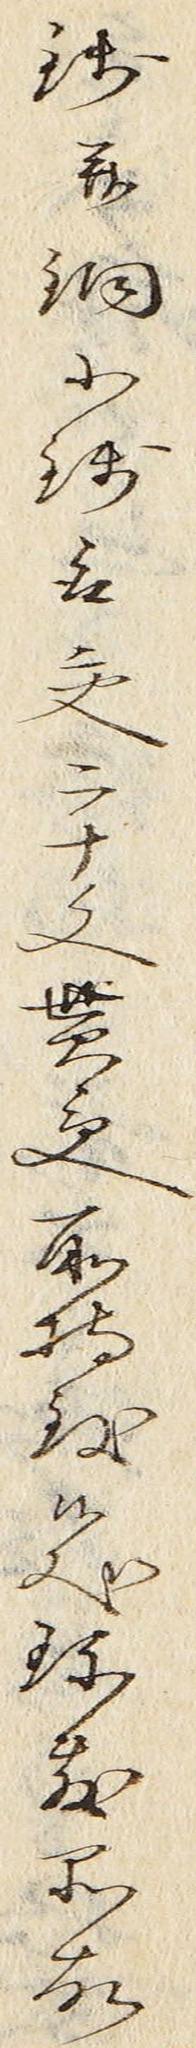銭并銅小銭取交二十文貰受所持致候処珍敷品故
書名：土佐中浜万次郎漂流記
